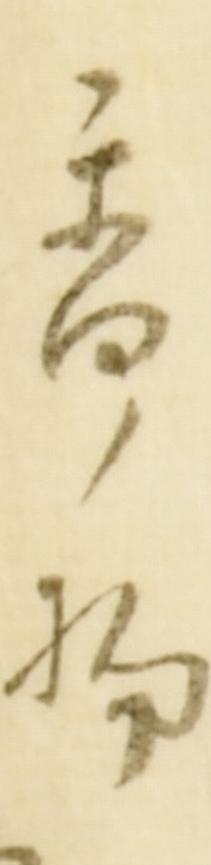香ノ物
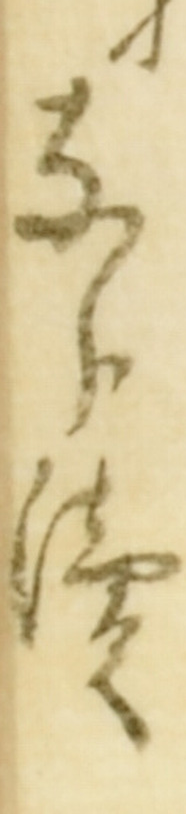なら漬

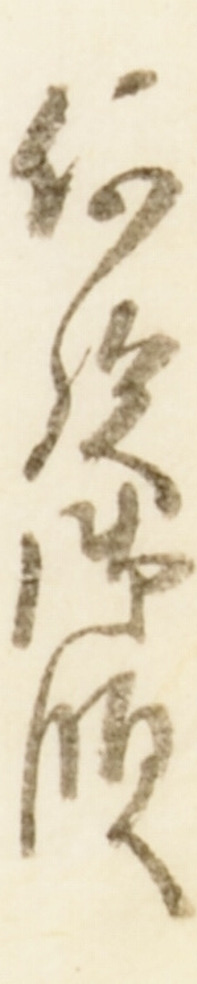何様御領
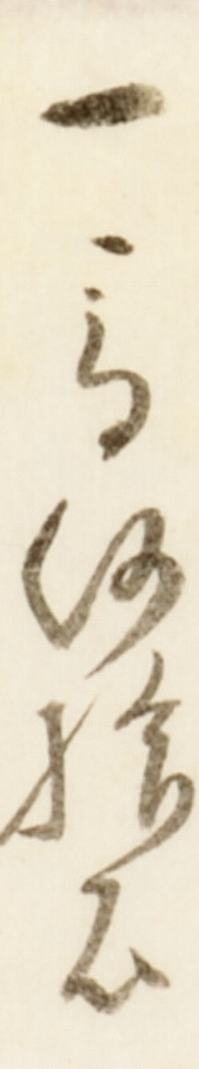一高何拾石
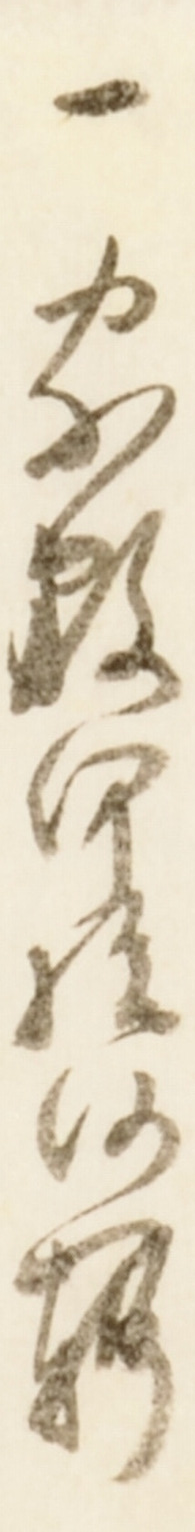一家数何拾何軒
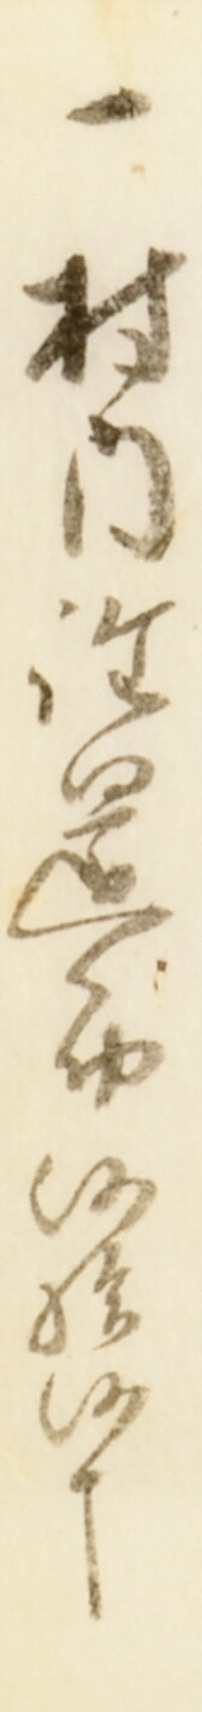一村内往還之筋何拾何丁
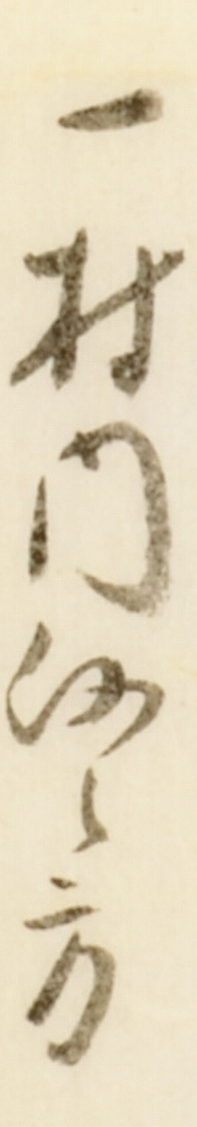一村内何之方
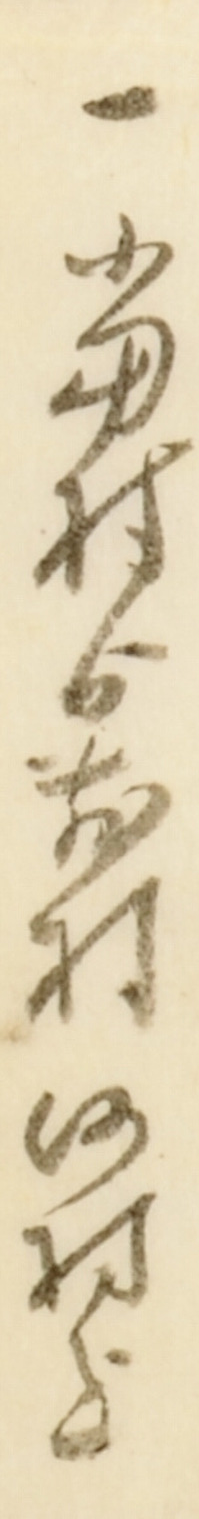一当村より前村何村迄
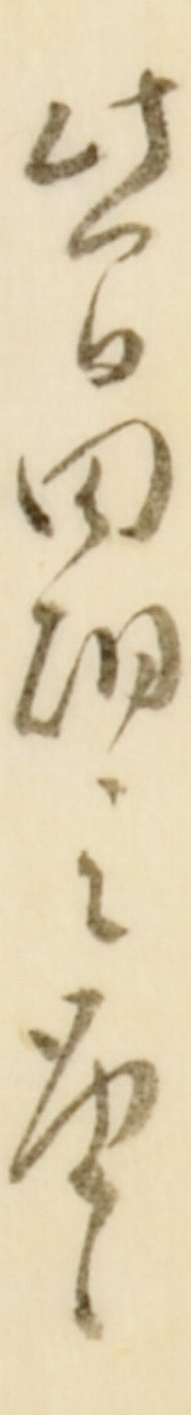此間田畑之ニて御座候
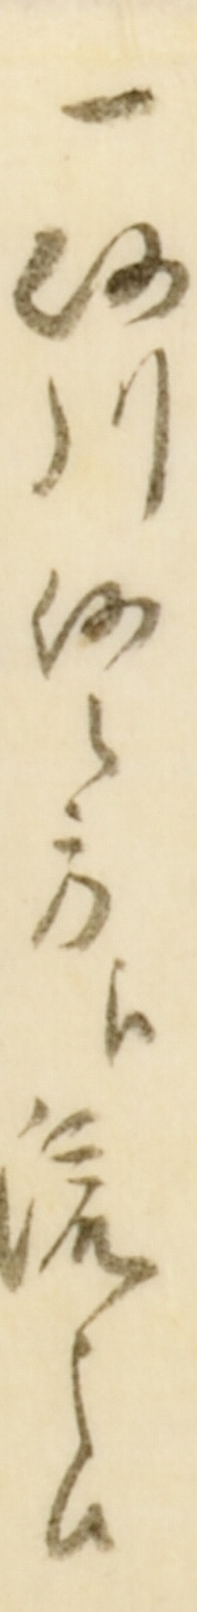一何川何之方江流申候
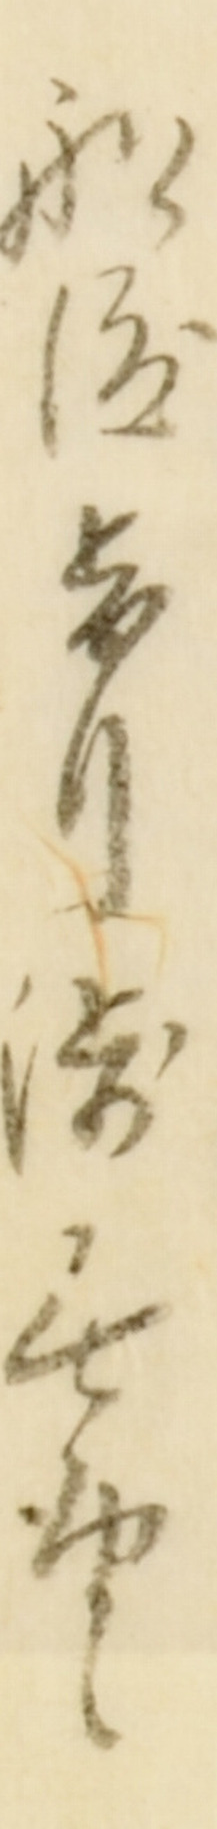船渡歩行渉無御座候
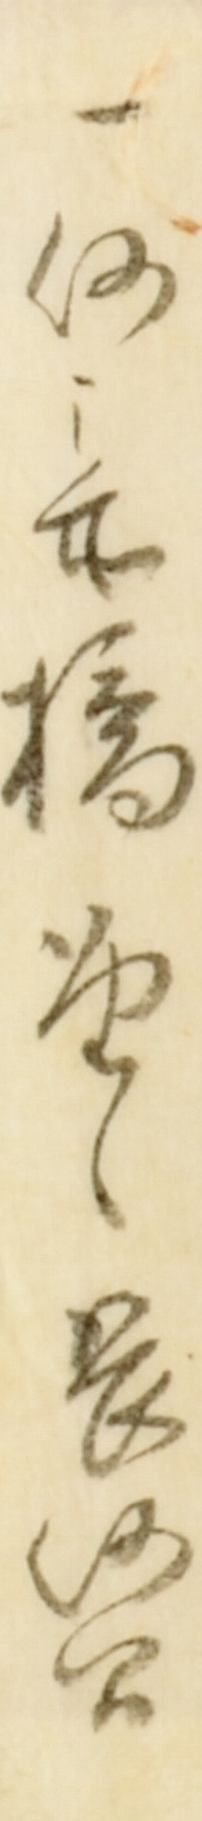一何之所橋御座候長何間

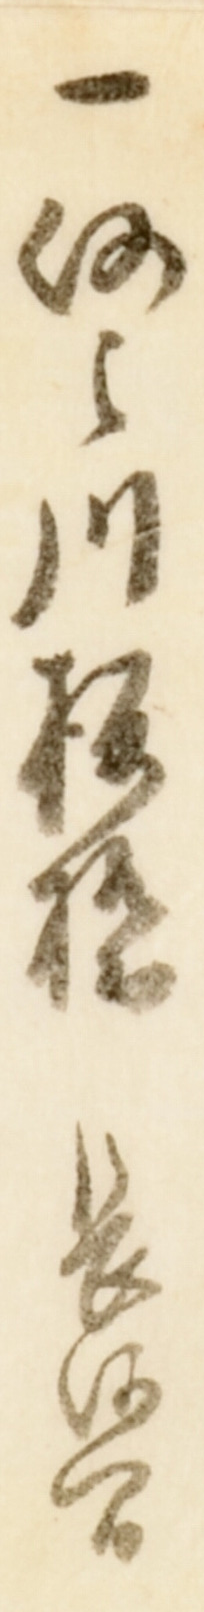一何之川板橋長何間
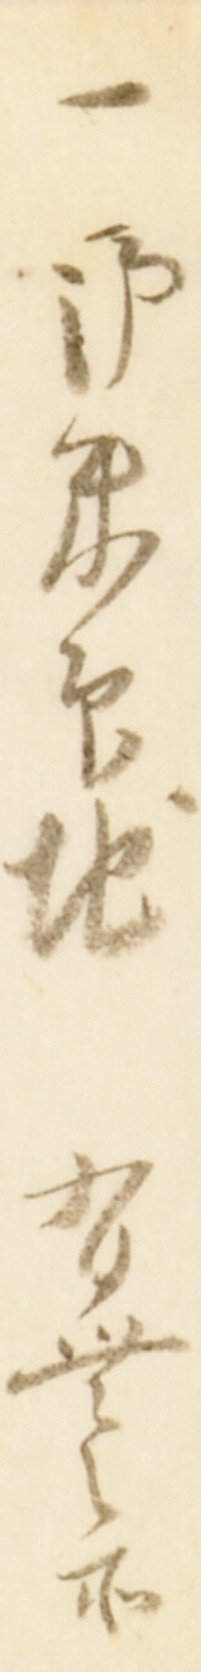一御朱印地有無之所
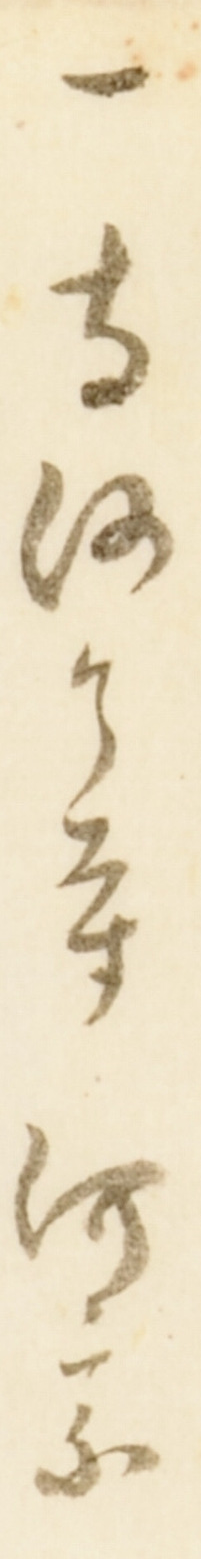一寺何々寺何宗
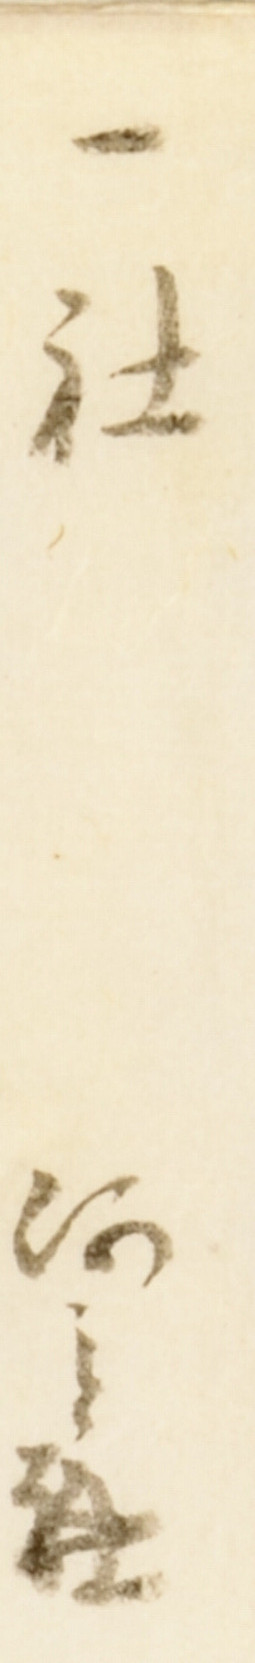一社何之社
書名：（覚）
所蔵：伊那市立高遠町図書館・合同会社AMANE
